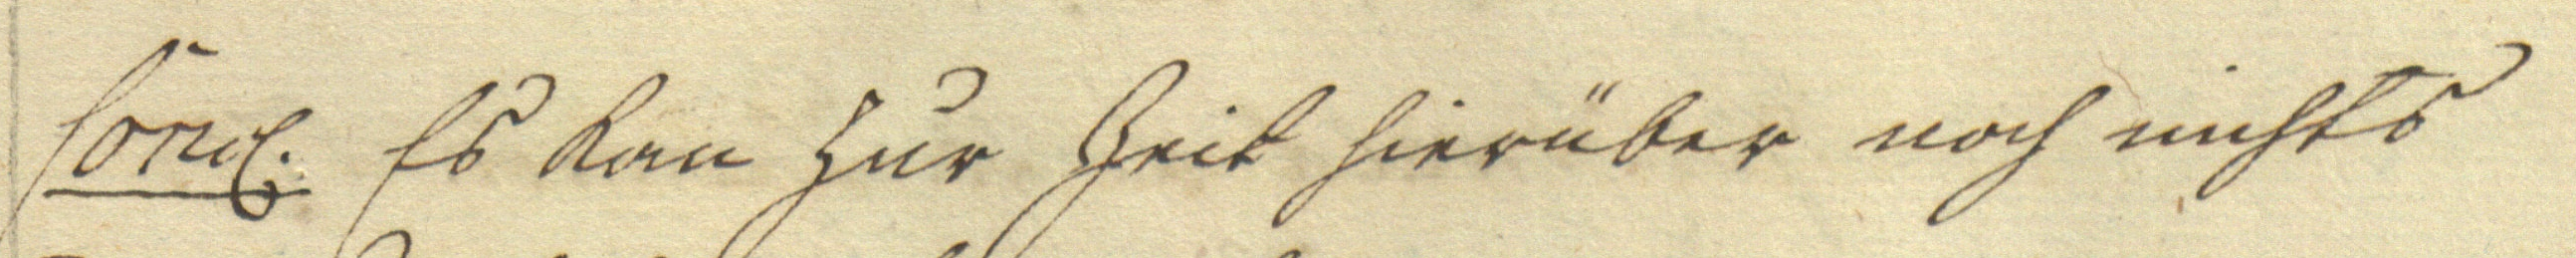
Concl. Es kan zur Zeit hierüber noch nichts
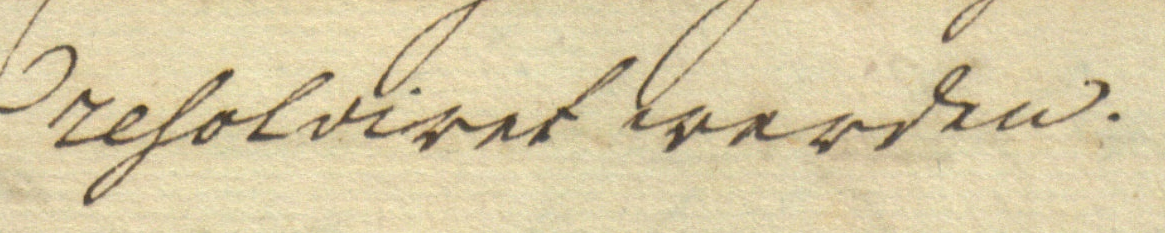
resolviret werden.
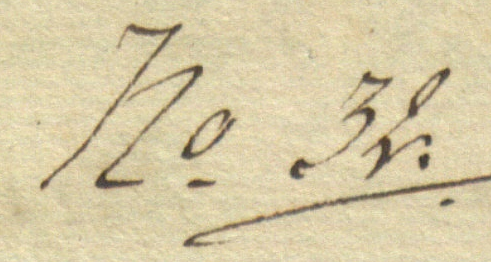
No 32.
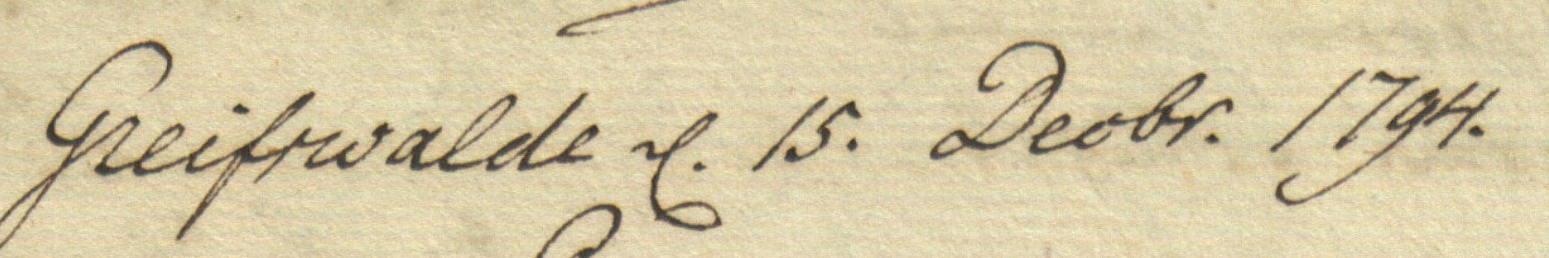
Greifswalde d. 15. Decbr. 1794.
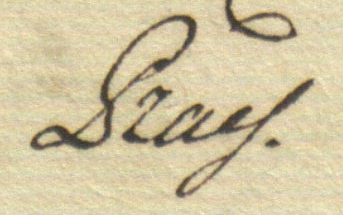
Praes.
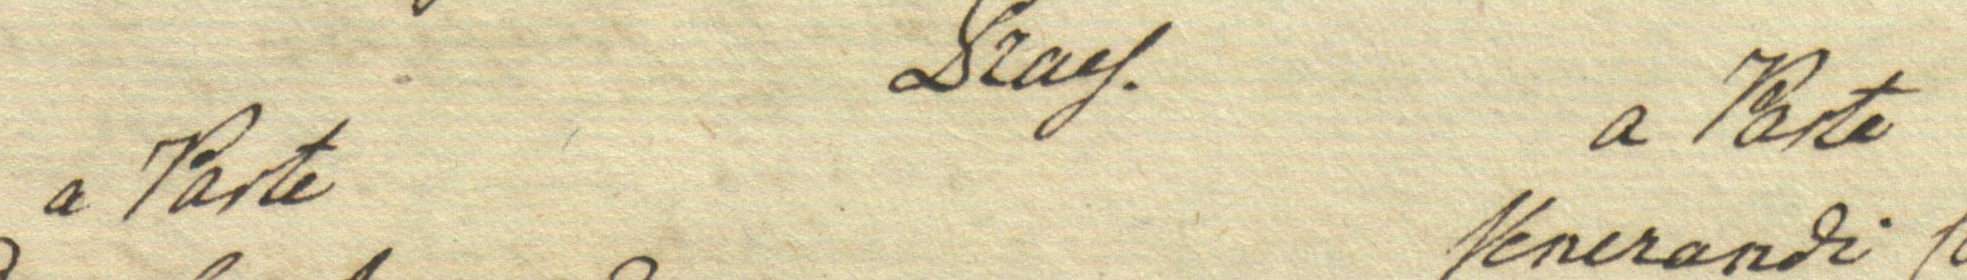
a Parte a Parte
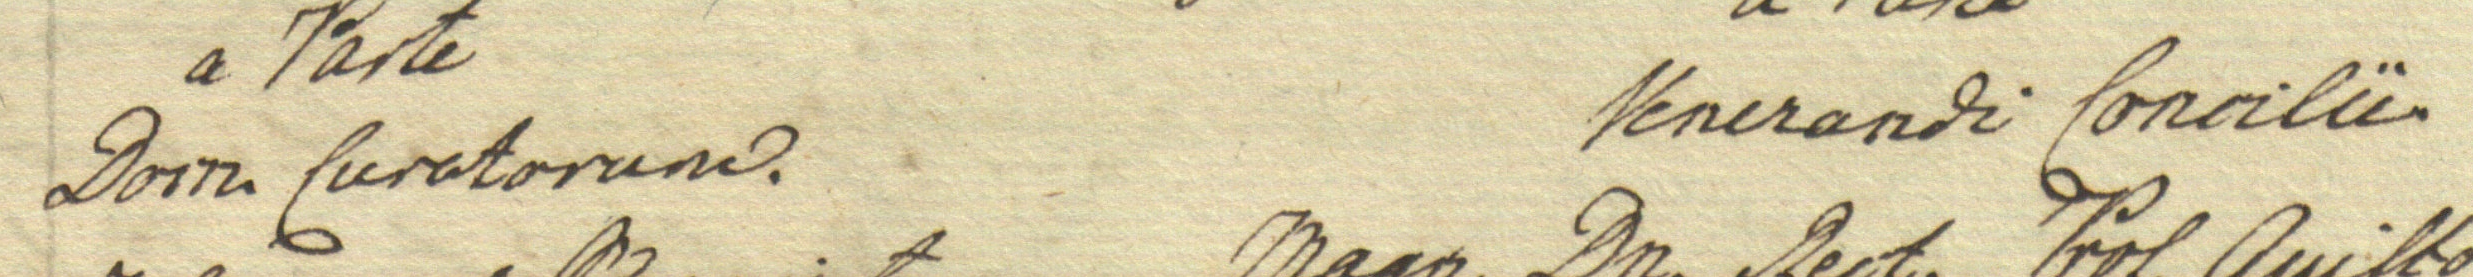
Dom. Curatorum. Venerandi Concilii
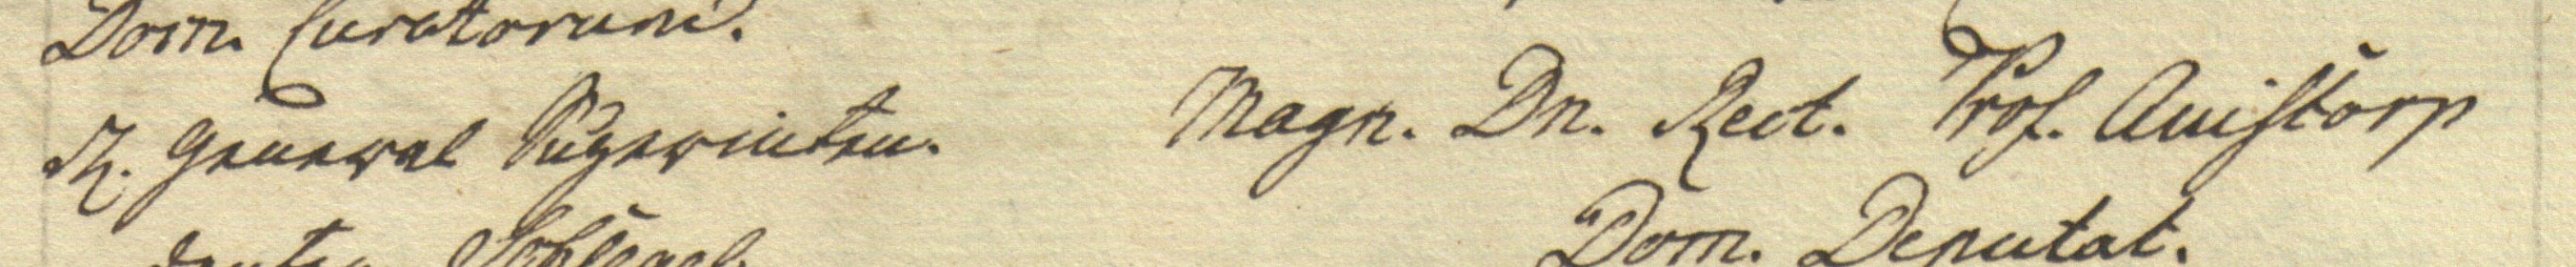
dh. General Superinten¬ Magn. Dn. Rect. Prof. Quistorp
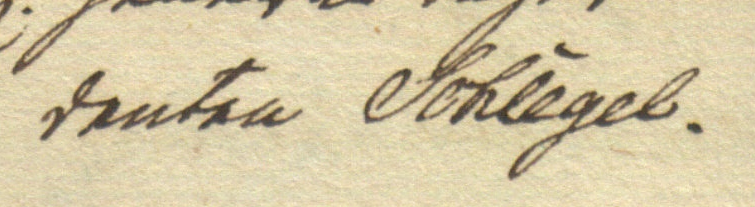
denten Schlegel.
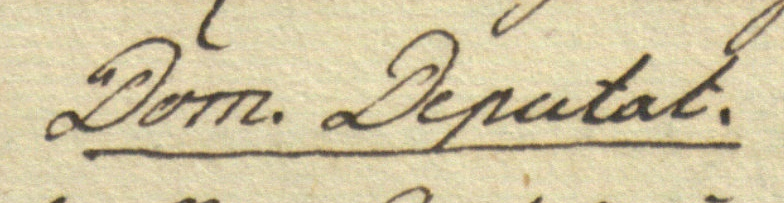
Dom. Deputat.
